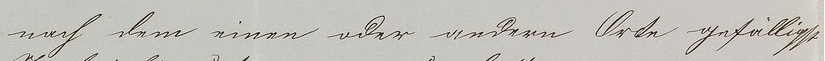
nach dem einen oder andern Orte gefälligst
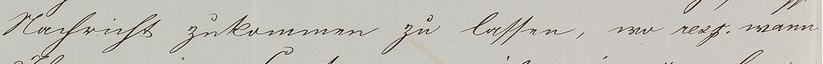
Nachricht zukommen zu lassen, wo resp. wann
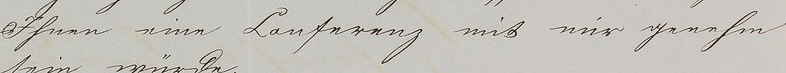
Ihnen eine Conferenz mit mir genehm
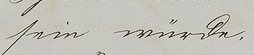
sein würde.
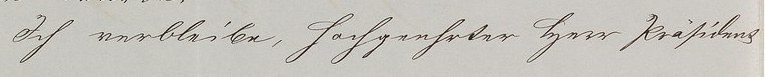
Ich verbleibe, hochgeehrter Herr Präsident
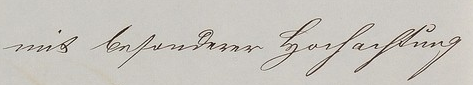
mit besonderer Hochachtung
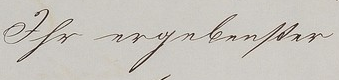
Ihr ergebenster
